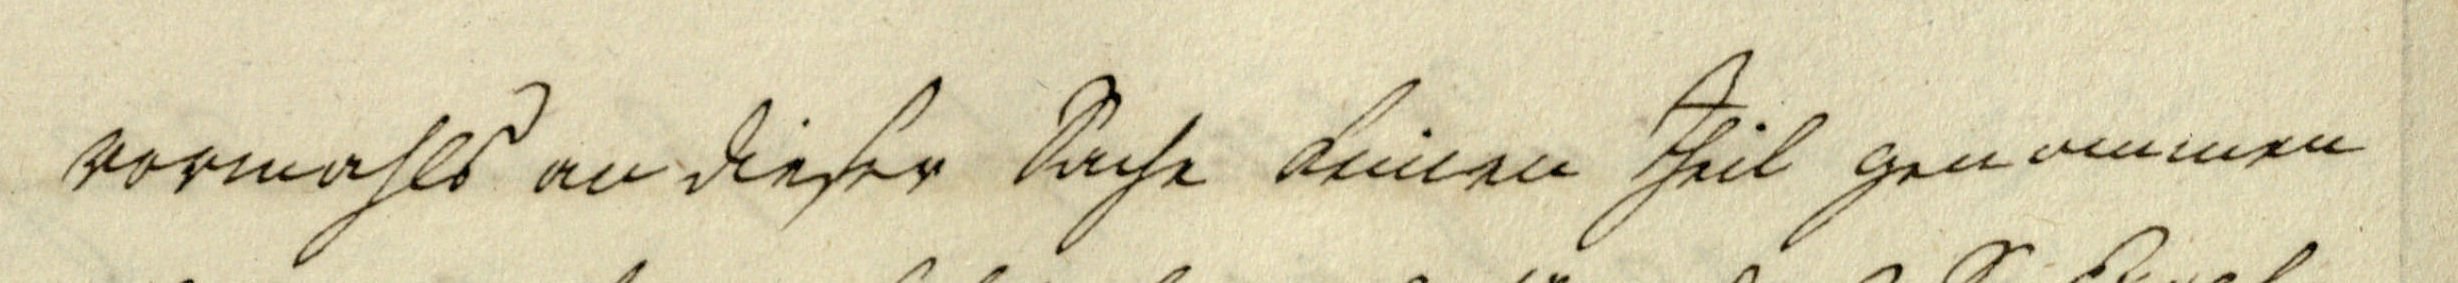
vormahls an dieser Sache keinen Theil genommen
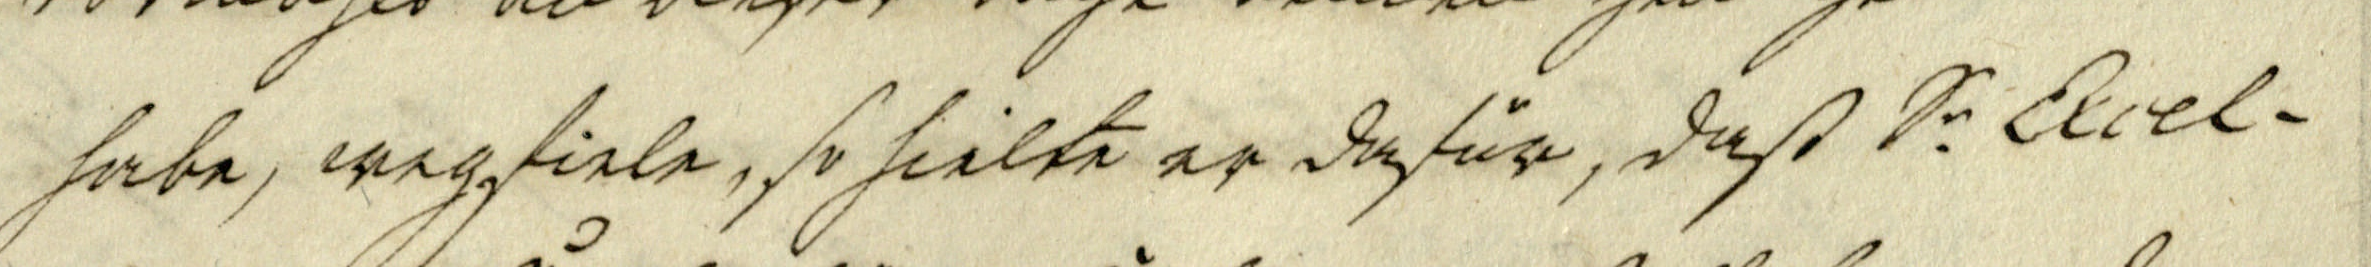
habe, wegfiele, so hielte er dafür, daß Sr. Excel¬
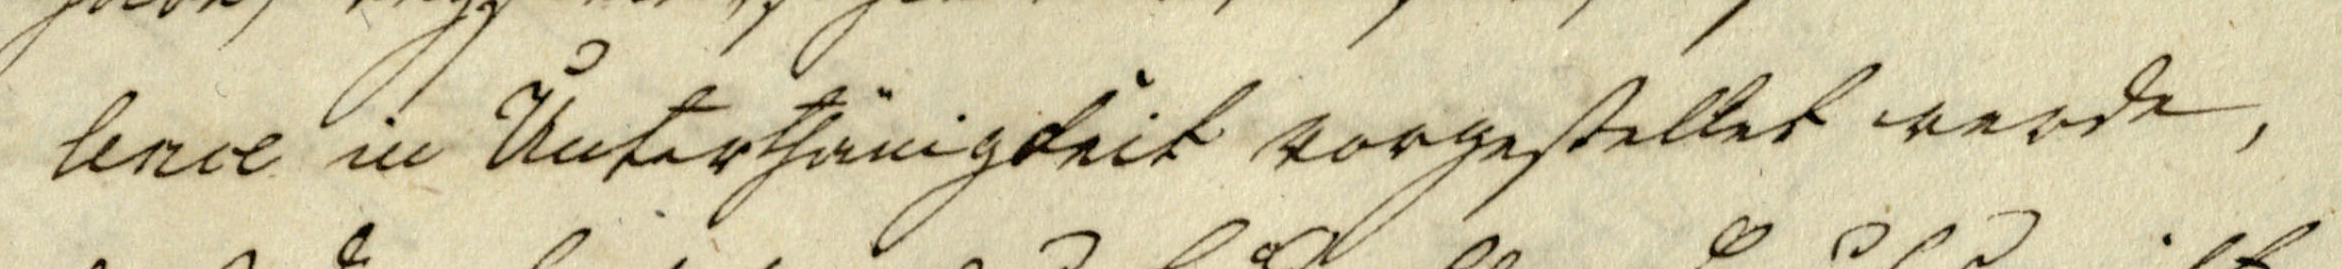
lence in Unterthänigkeit vorgestellet werde,
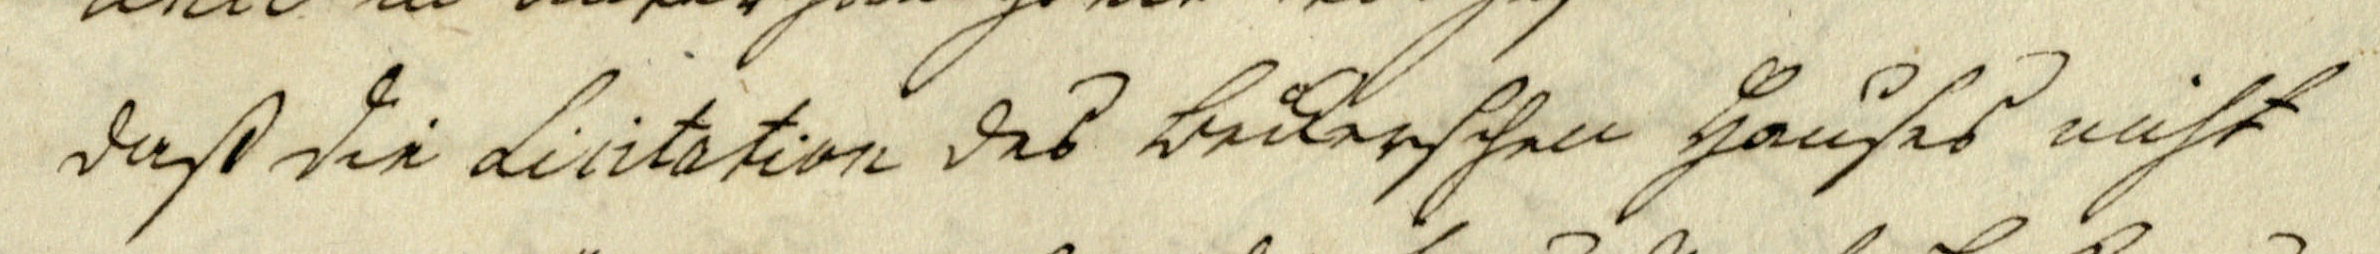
daß die Licitation des Beckerschen Hauses nicht
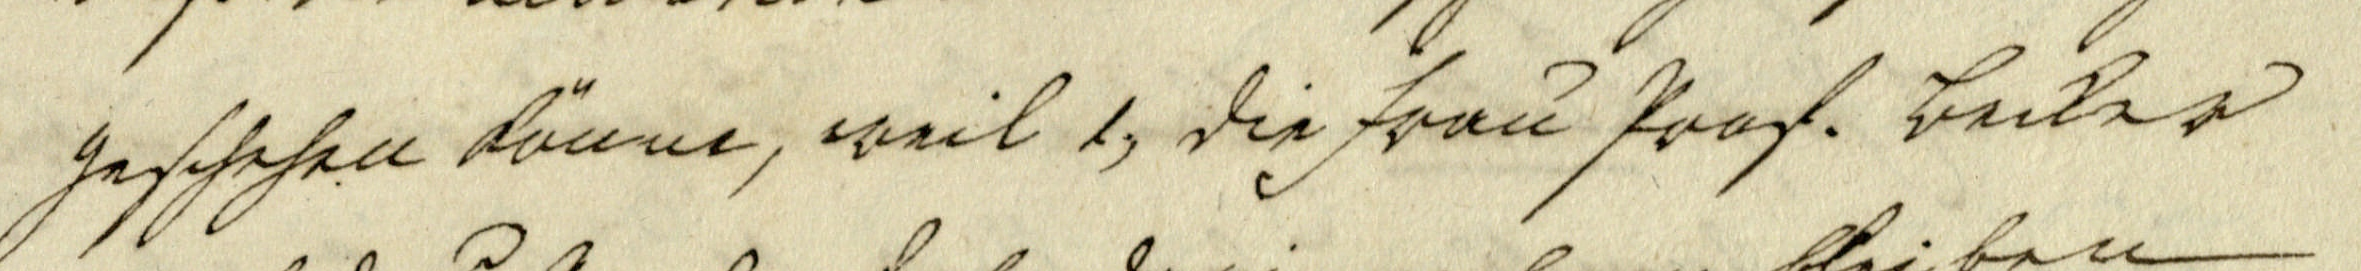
geschehen könne, weil 1., die Frau Prof. Becker
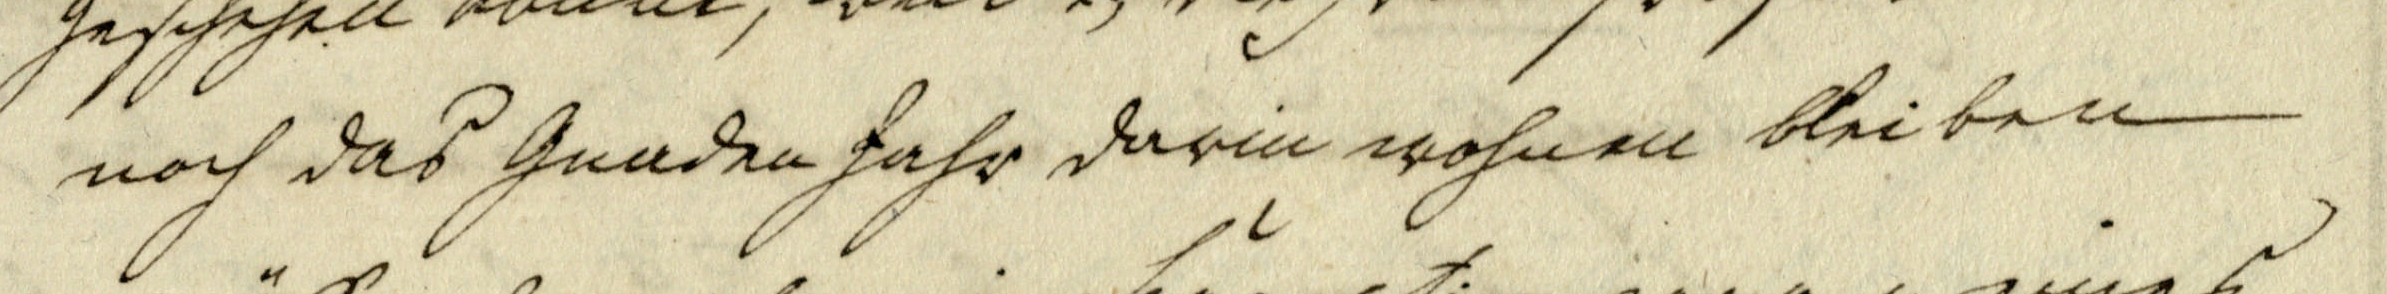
noch das Gnaden Jahr darin wohnen bleiben
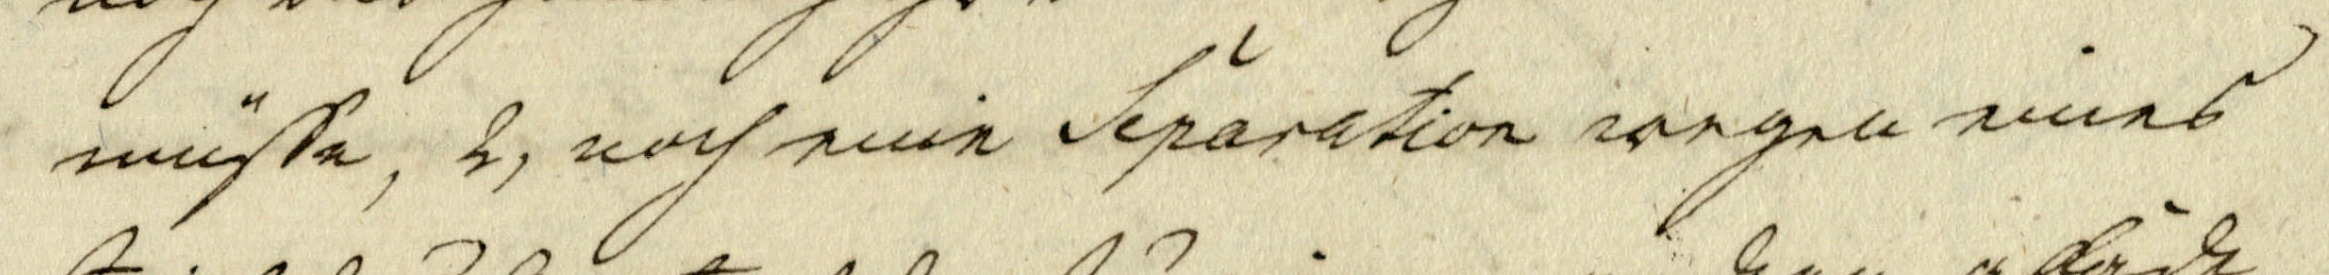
müsse, 2, noch eine Separation wegen eines
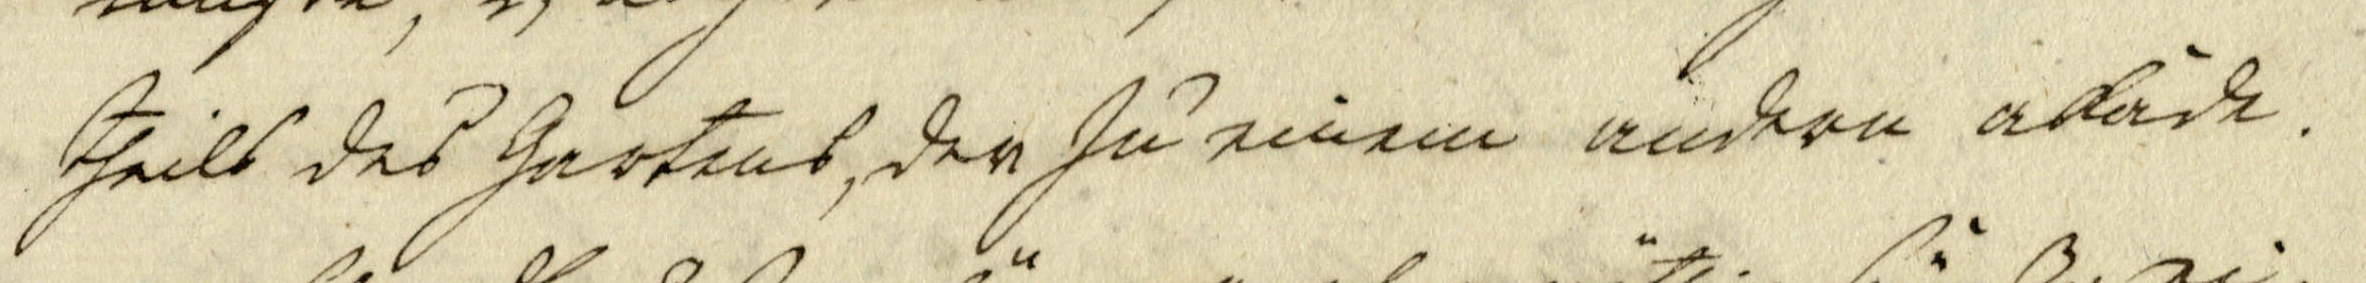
Theils des Gartens, der zu einem andern akade¬
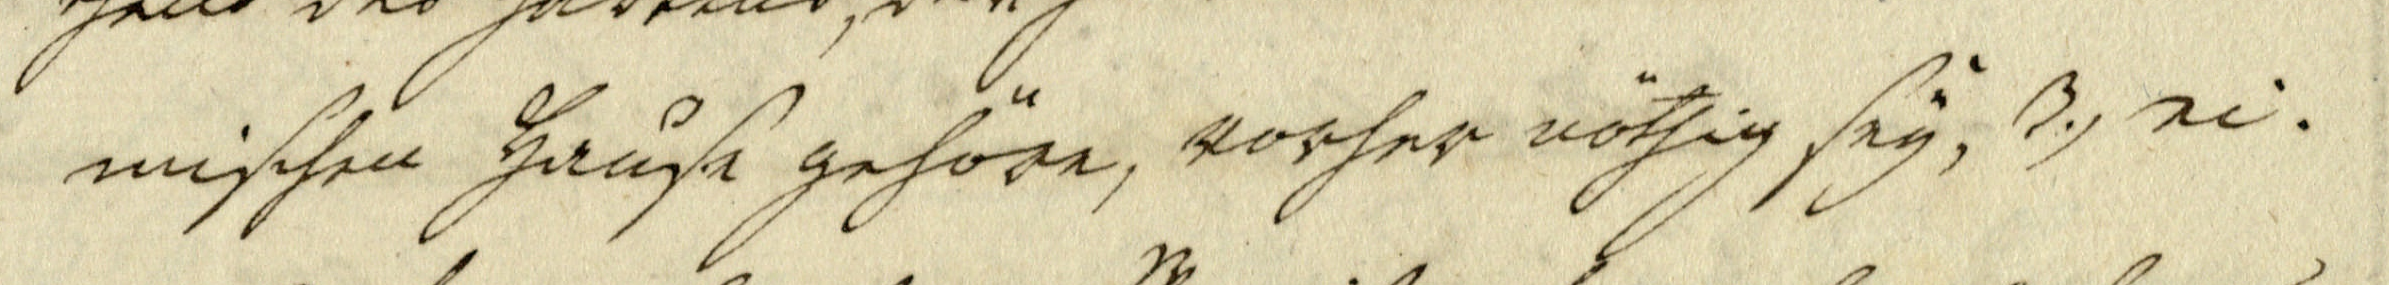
mischen Hause gehöre, vorher nöthig seÿ, 3, ei¬
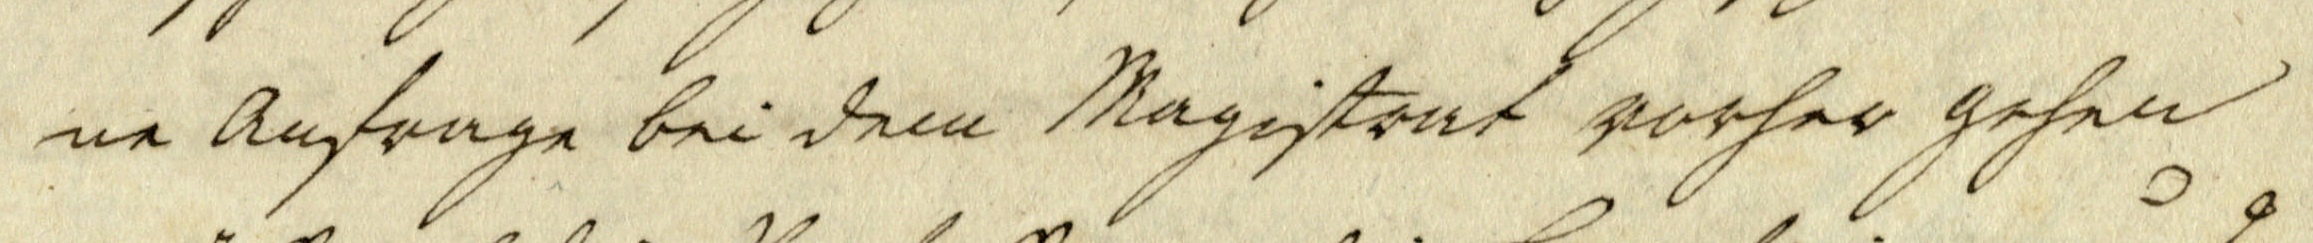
ne Anfrage bei dem Magistrat vorher gehen
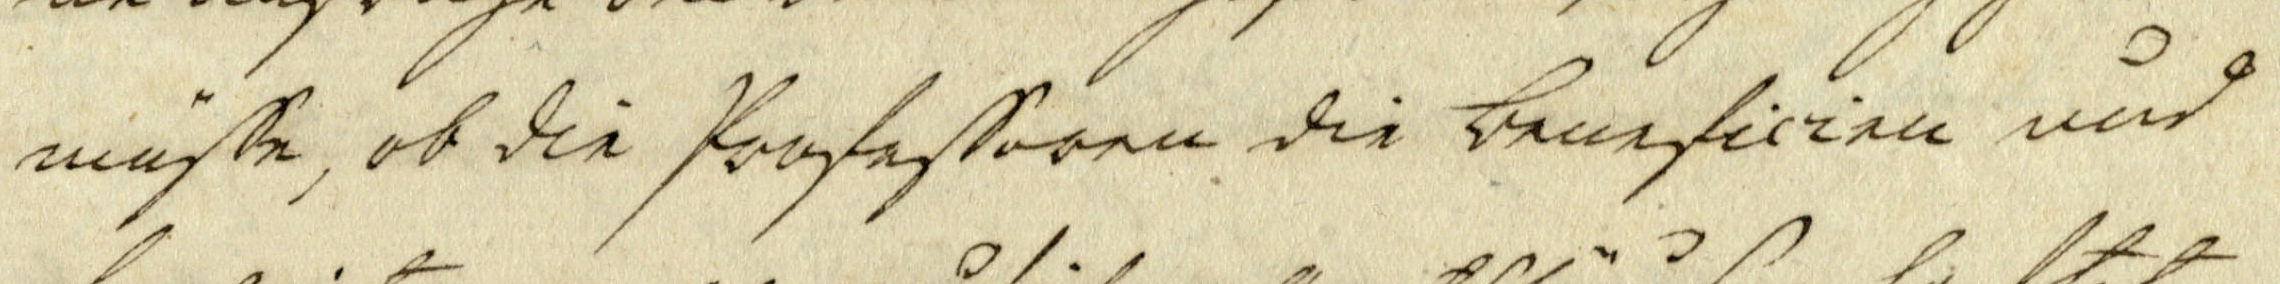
müsse, ob die Professoren die Beneficien und
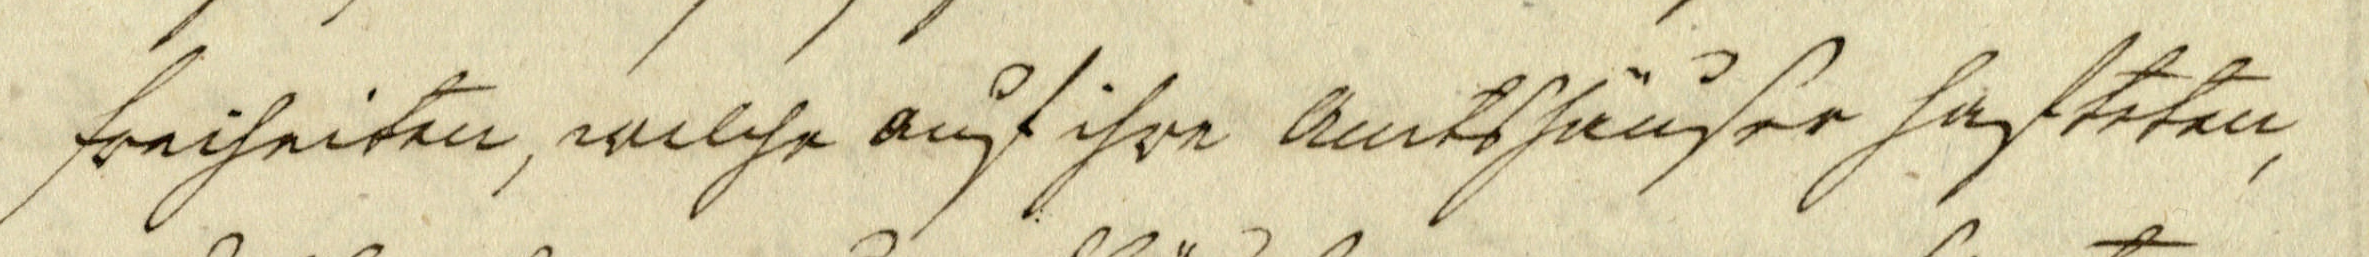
Freiheiten, welche auf ihre Amtshäuser hafteten,
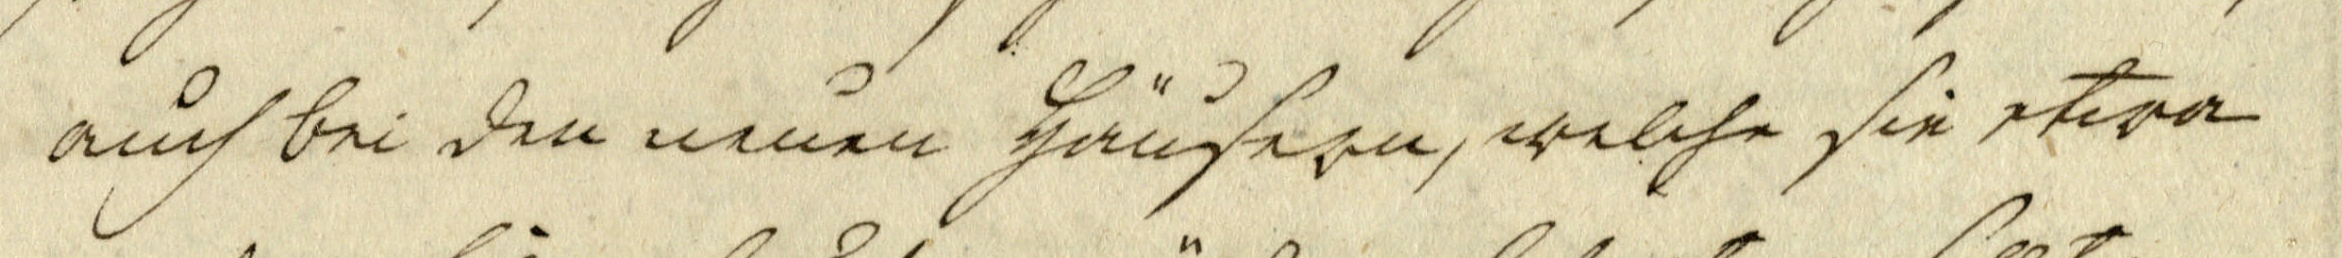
auch bei den neuen Häusern, welche sie etwa
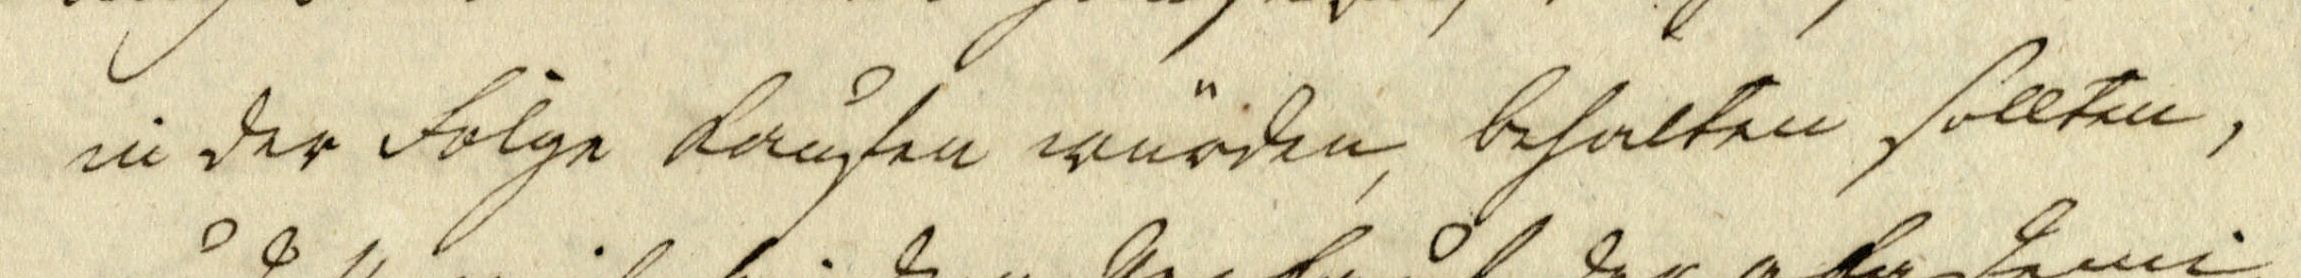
in der Folge kaufen würden, behalten sollten,
